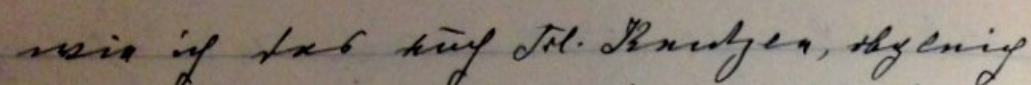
wie ich das auch Frl. Knutzen, obgleich
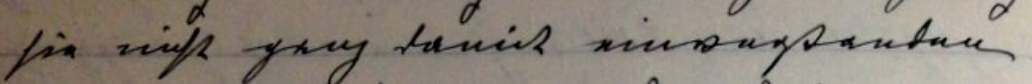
obgleich sie nicht ganz damit einverstanden
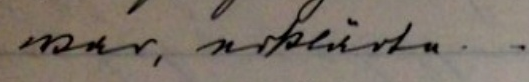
war, erklärte.
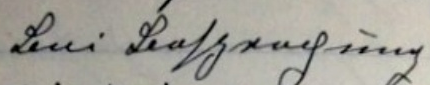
Bei Besprechung
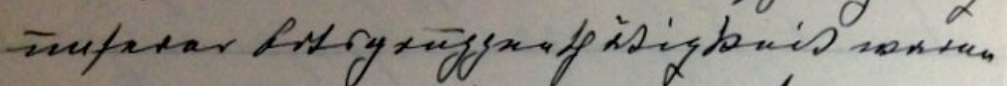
unserer Ortsgruppenthätigkeit waren
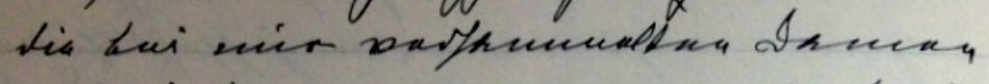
die bei mir versammelten Damen
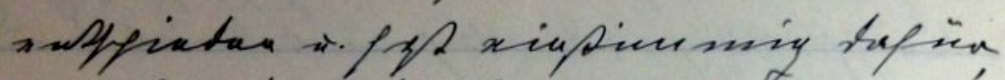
entschieden u. fast einstimmig dafür
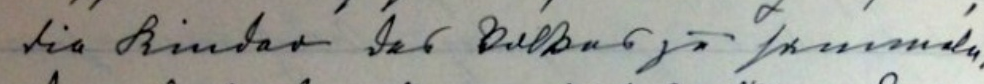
die Kinder des Volkes zu sammeln.
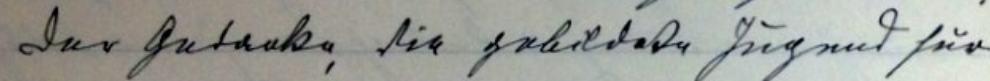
Der Gedanke die gebildete Jugend für
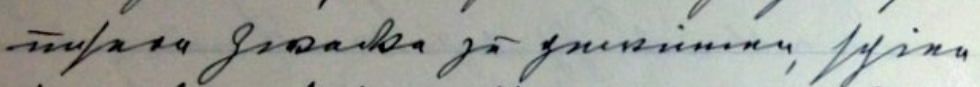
unsere Zwecke zu gewinnen, schien
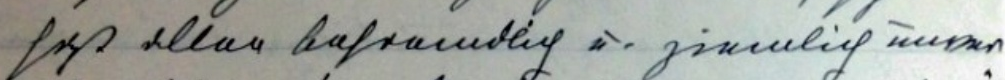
fast allen befremdlich u. ziemlich unver
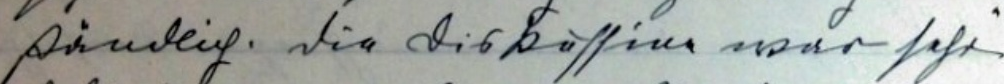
ständlich. Die Diskussion war sehr
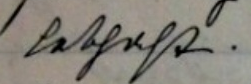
lebhaft
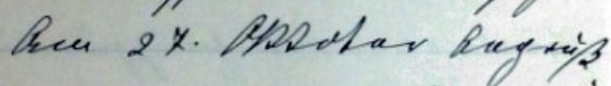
Am 27. Oktober begrüß
